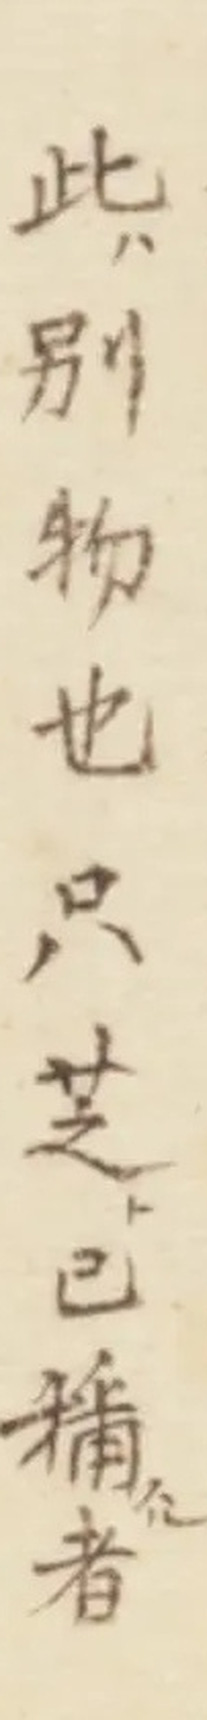此ハ別物也只芝ト已稱スル者
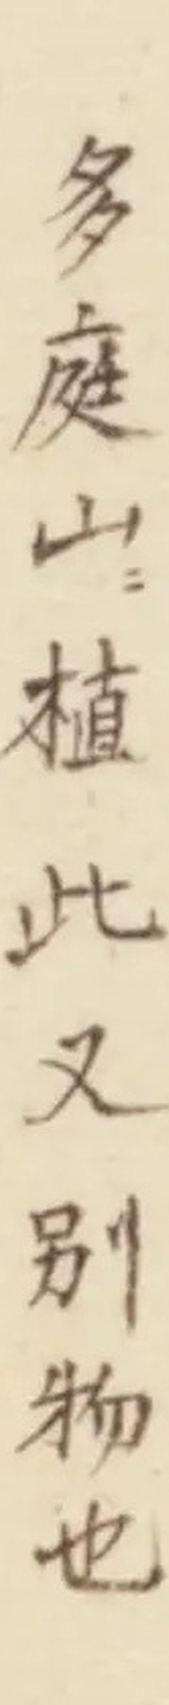多庭山ニ植此又別物也
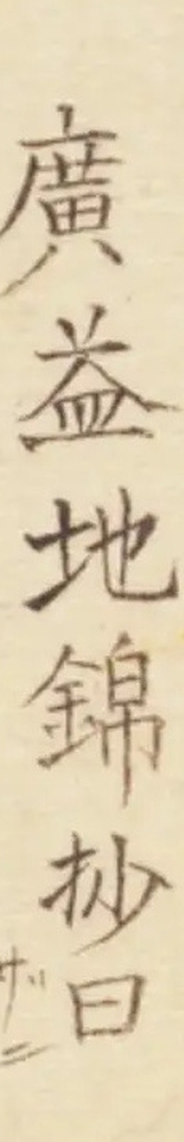廣益地錦抄曰
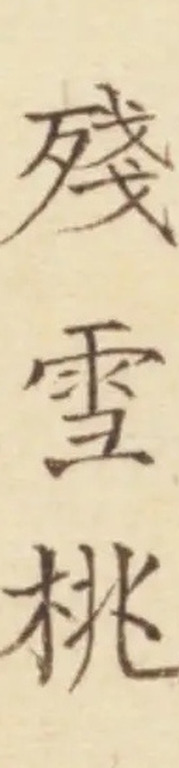殘雪桃
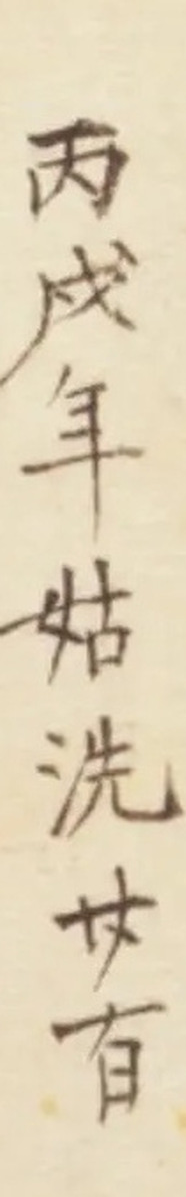丙戌年姑洗廿有
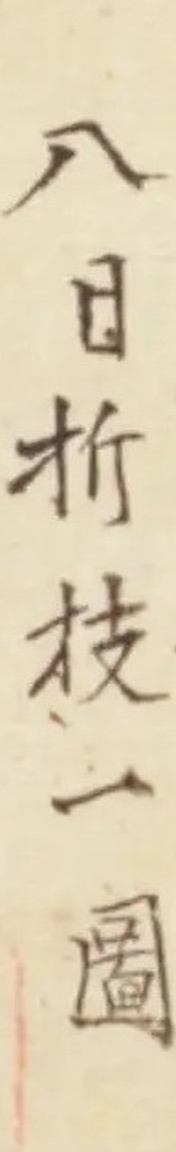八日折枝一寫

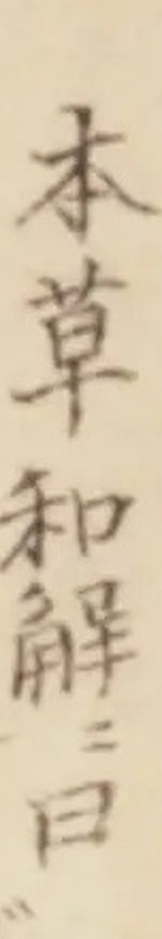本草和解に曰
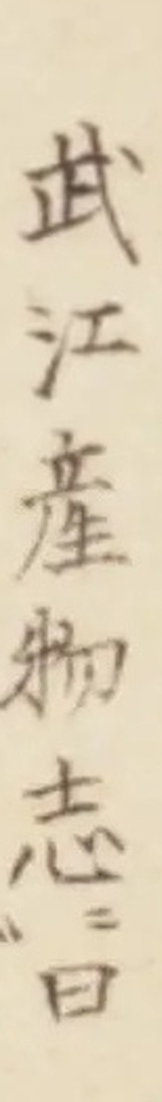武江産物志に曰
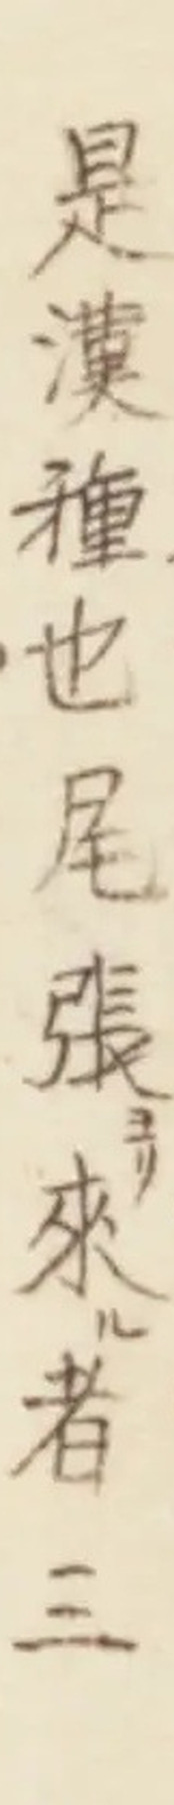是漢種也尾張より來る者三
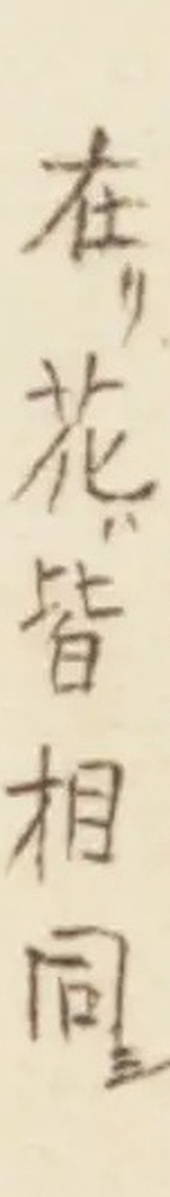在り花は皆相同し
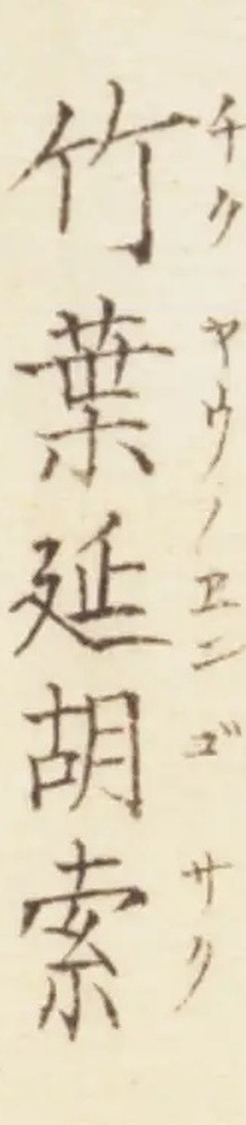竹葉延胡索
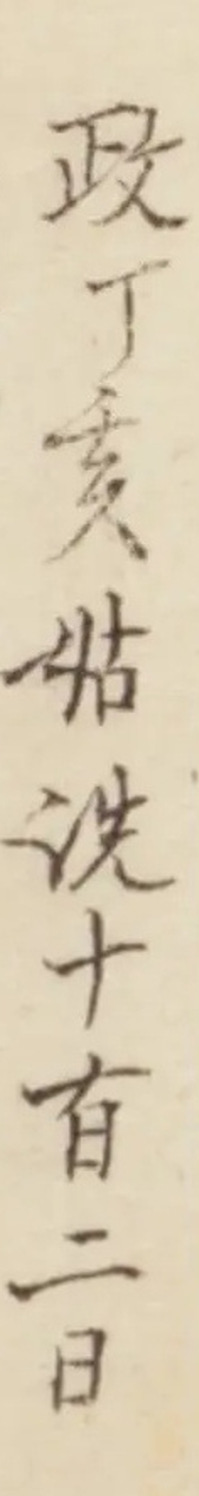政丁姑洗十有二日
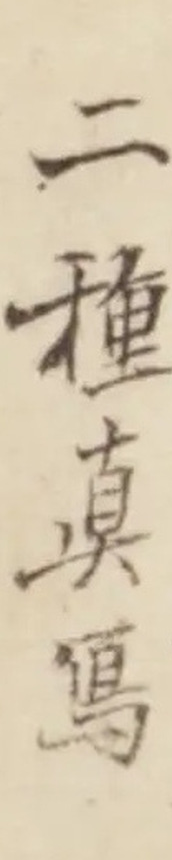二種真寫

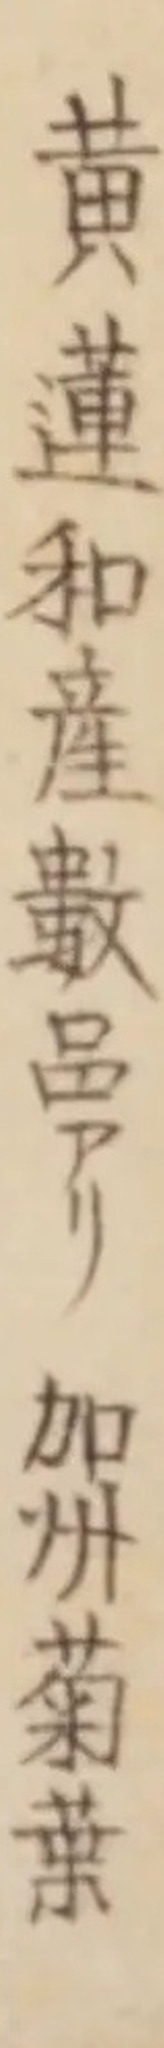黄連和産數品アリ加州菊葉
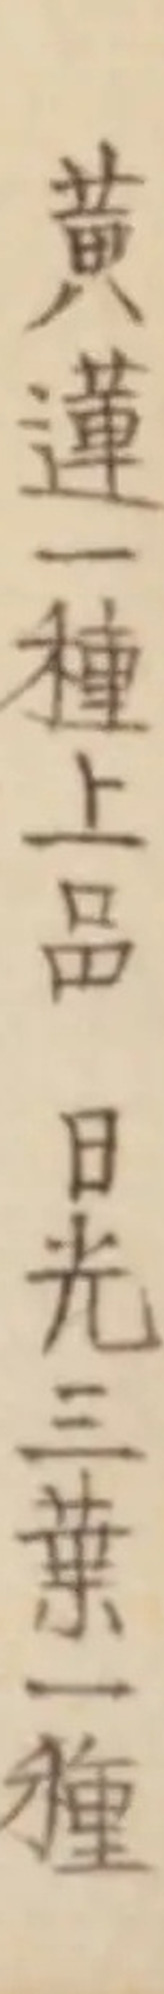黄連一種上品日光三葉一種
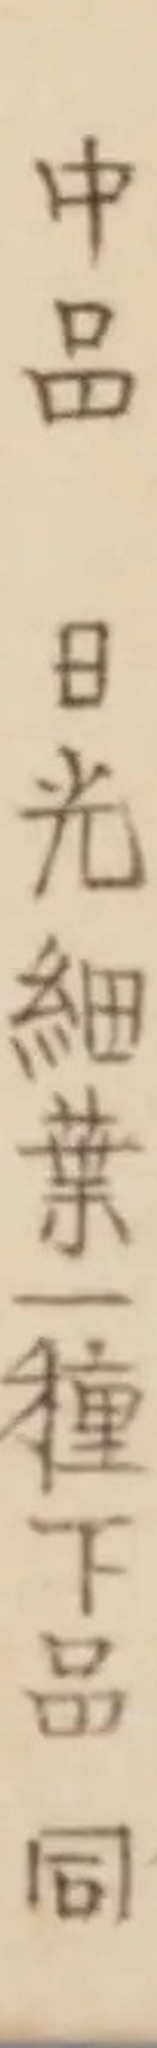中品日光細葉一種下品同
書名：梅園草木花譜春之部. 3
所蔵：国立国会図書館 National Diet Library, JAPAN
